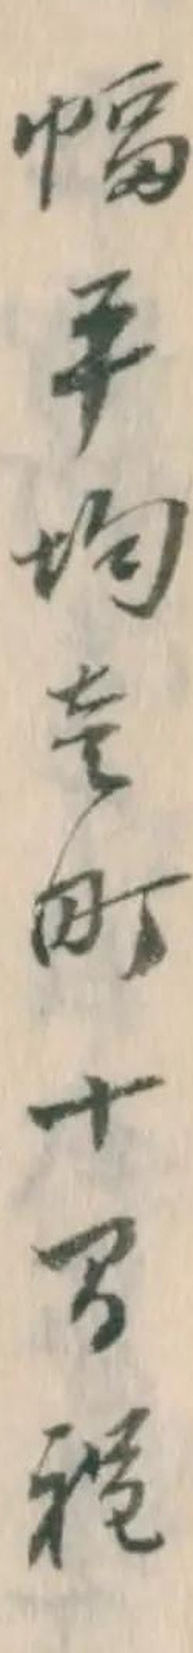幅平均壱町十間程
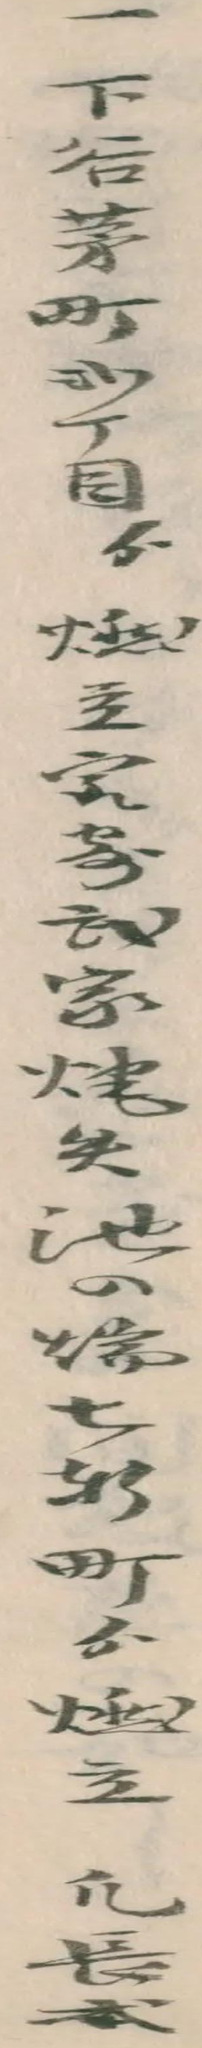一下谷茅町弐丁目ゟ燃立最寄武家焼失池の端七軒町ゟ燃立凡長弐
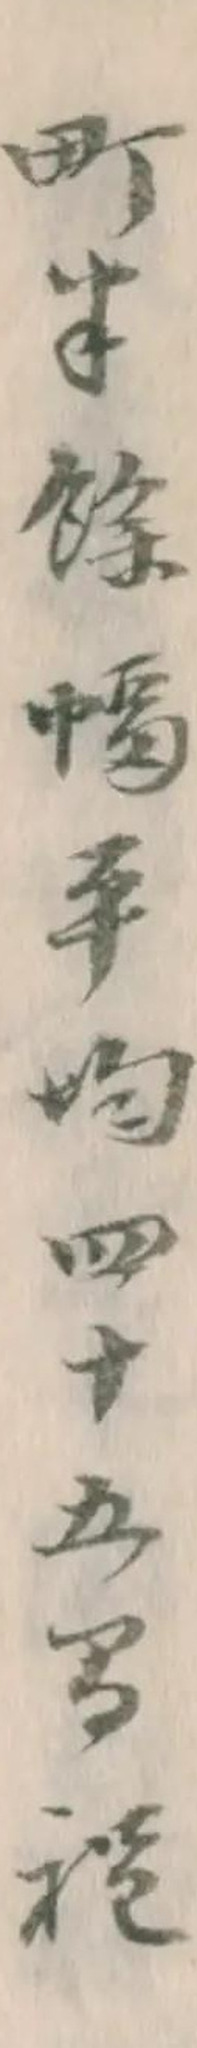町半余幅平均四十五間程
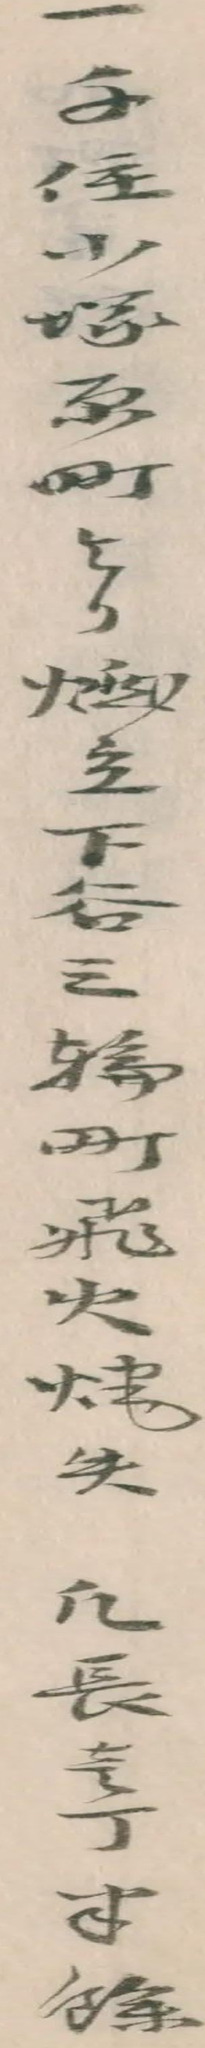一千住小塚原町より燃立下谷三輪町飛火焼失凡長壱丁半余
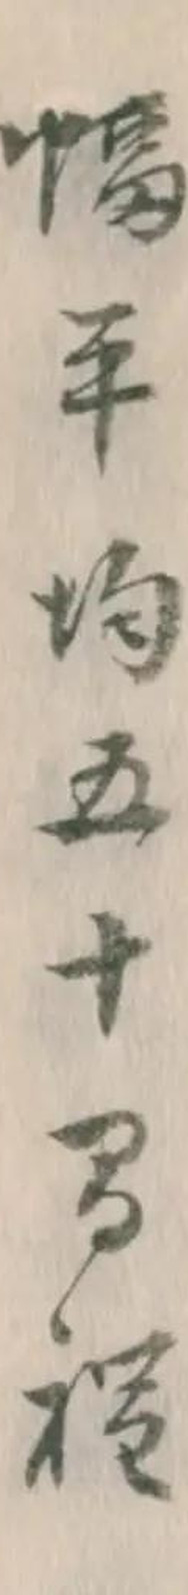幅平均五十間程
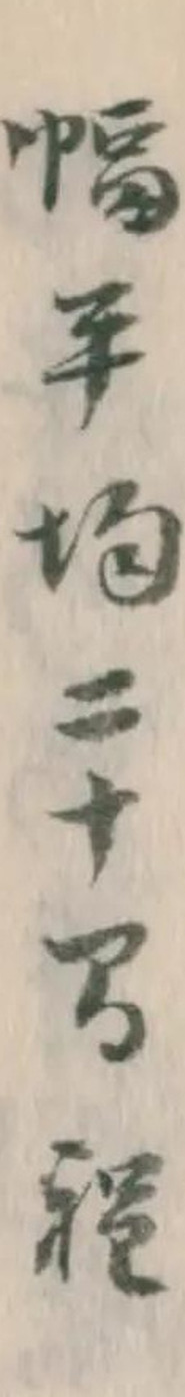幅平均二十間程
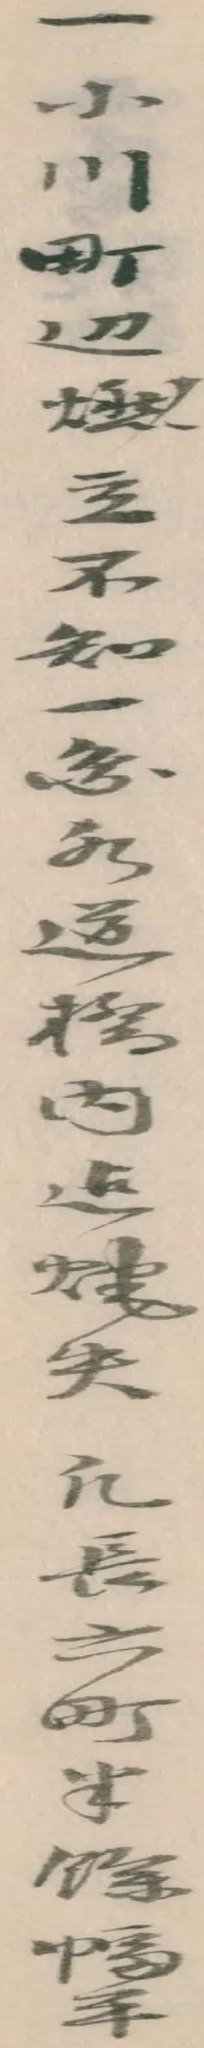一小川町辺燃立不知一円水道橋内迄焼失凡長六町半余幅平
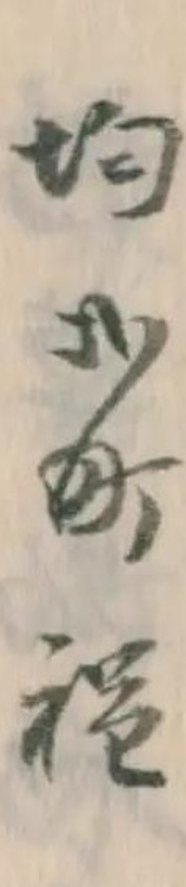均弐町程
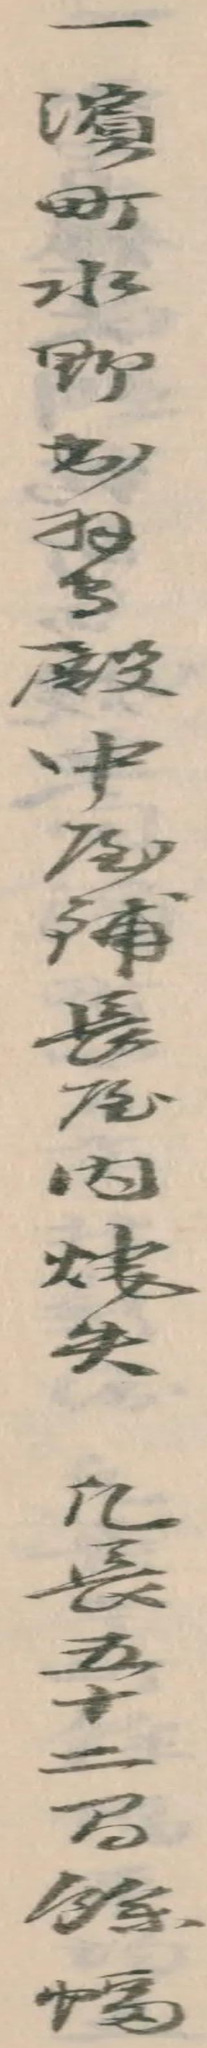一浜町水野出羽守殿中屋鋪長屋内焼失凡長五十二間余幅
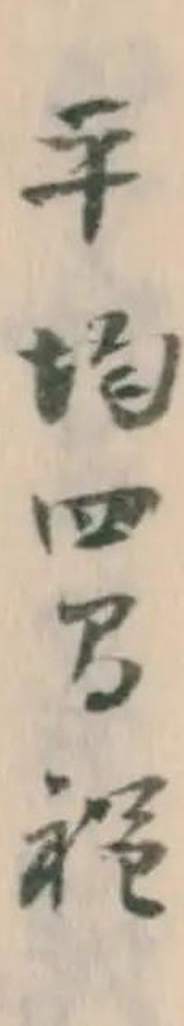平均四間程
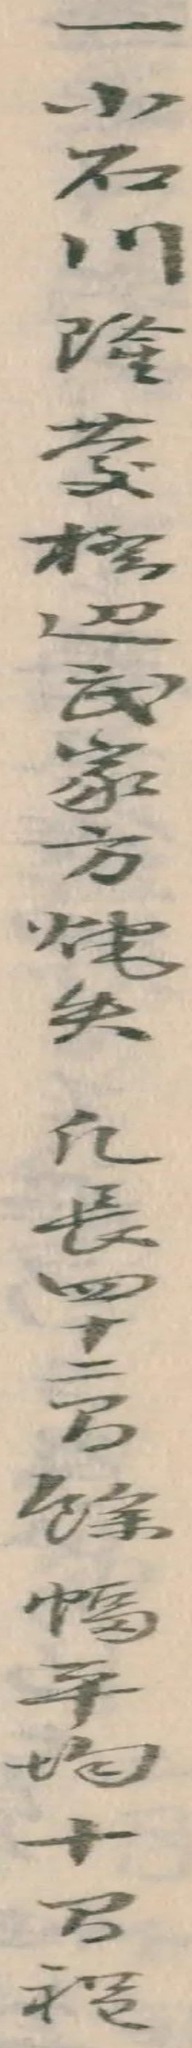一小石川隆慶橋辺武家方焼失凡長四十二間余幅平均十間程
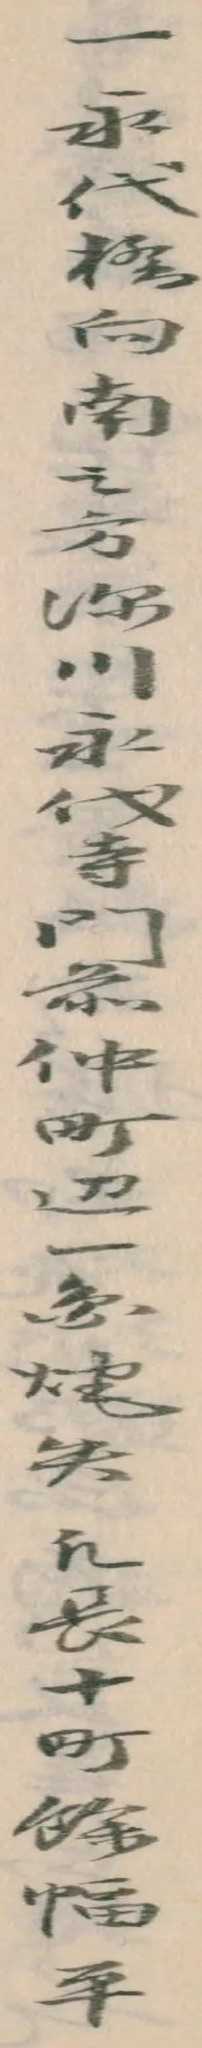一永代橋向南之方深川永代寺門前仲町辺一円焼失凡長十町余幅平
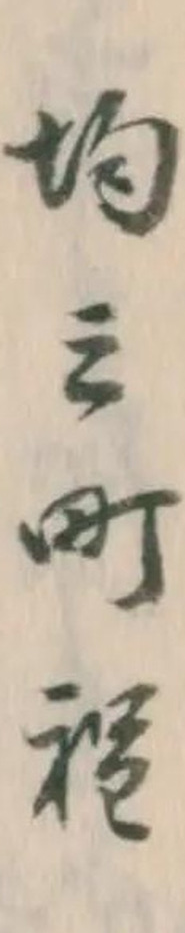均三町程
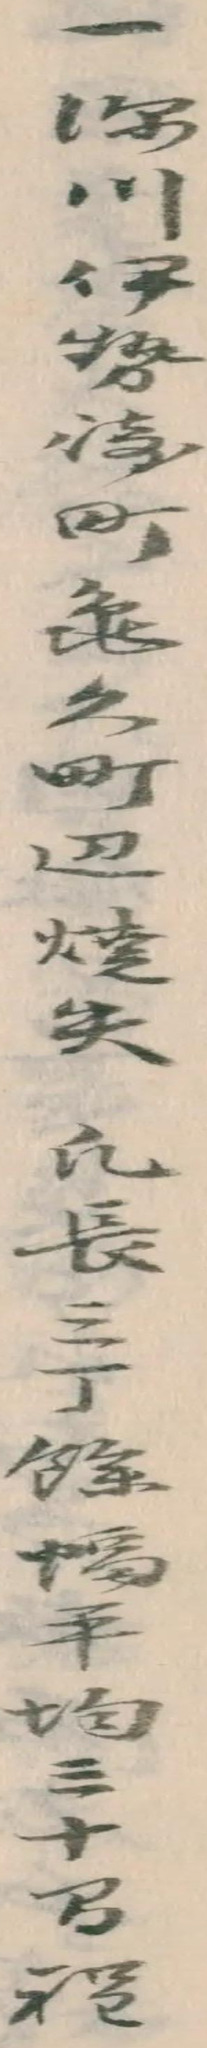一深川伊勢崎町亀久町辺焼失凡長三丁余幅平均三十間程
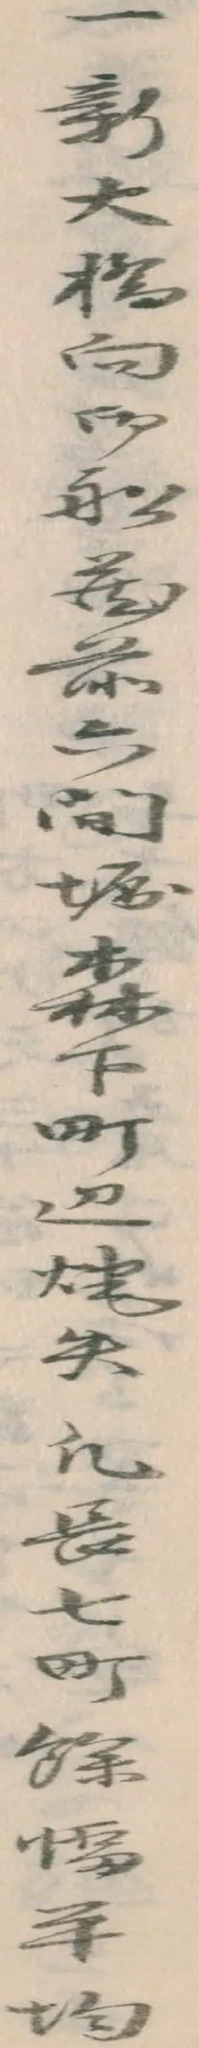一新大橋向御船蔵前六間堀森下町辺焼失凡長七町余幅平均
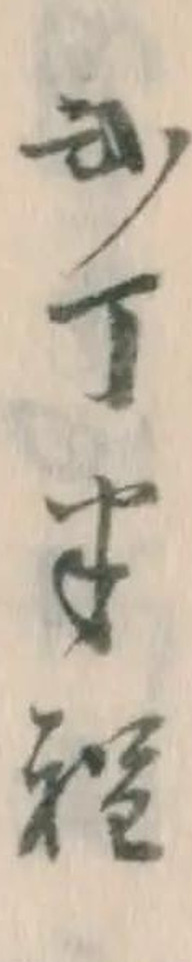弐丁半程
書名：地災撮要. 巻7-9(地震之部)
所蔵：国立国会図書館 National Diet Library, JAPAN
